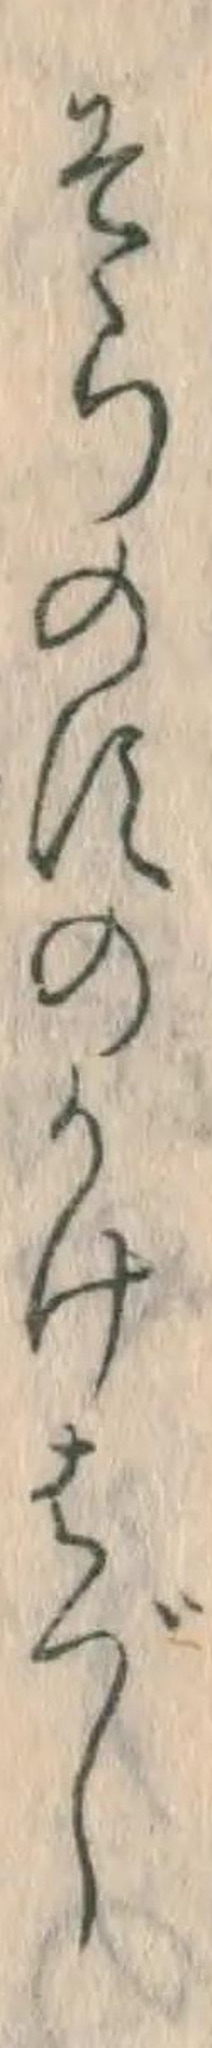そらのすのかけはづし
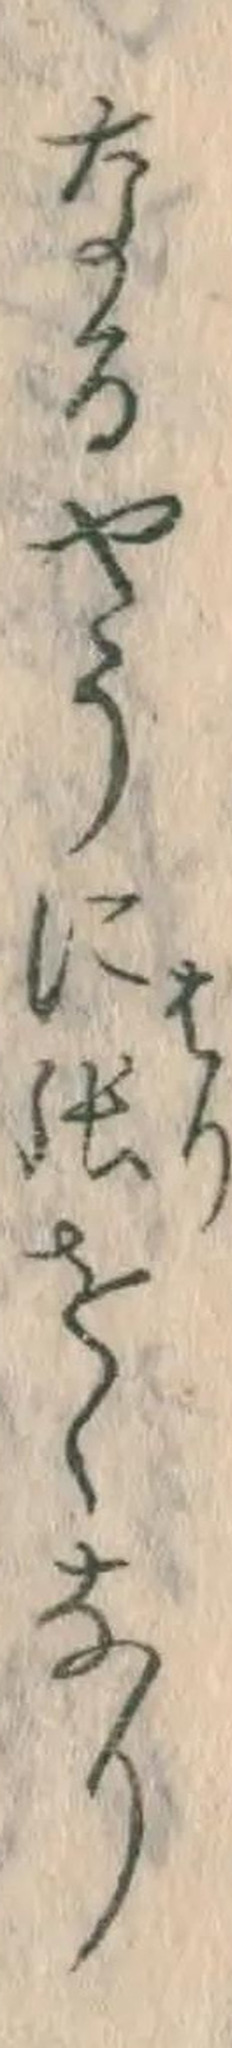なるやうに張をくなり
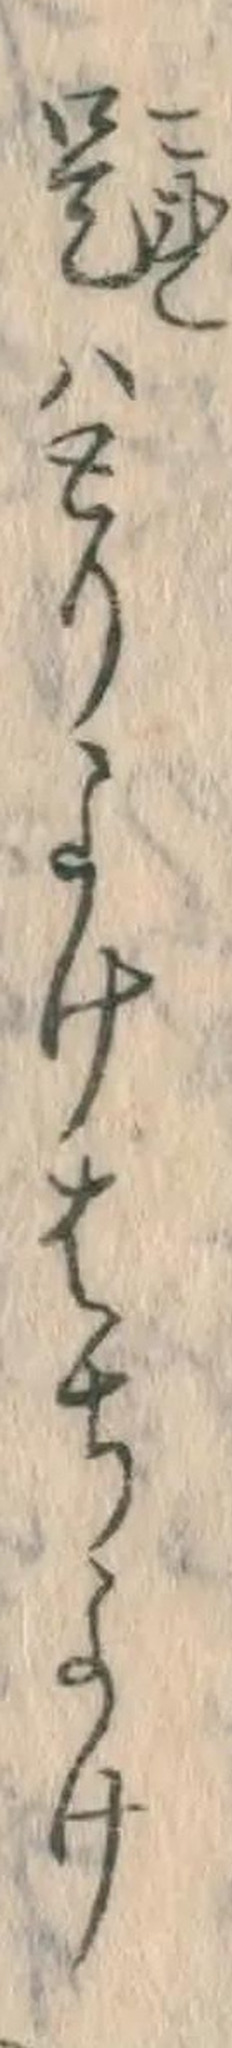是はとりよけはちよけ
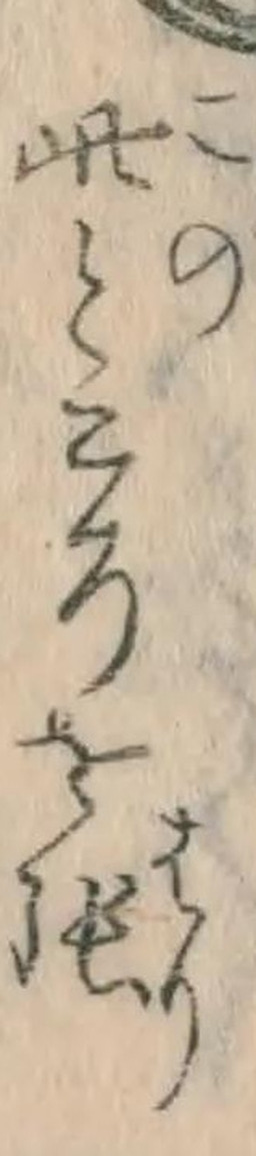此ところを張
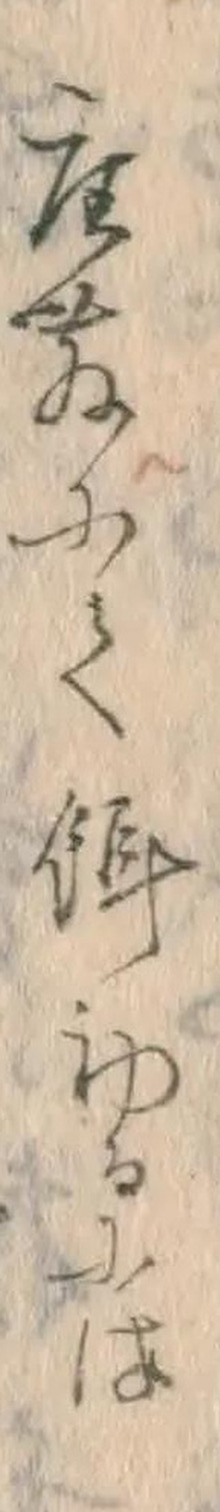座敷にて餌初るには
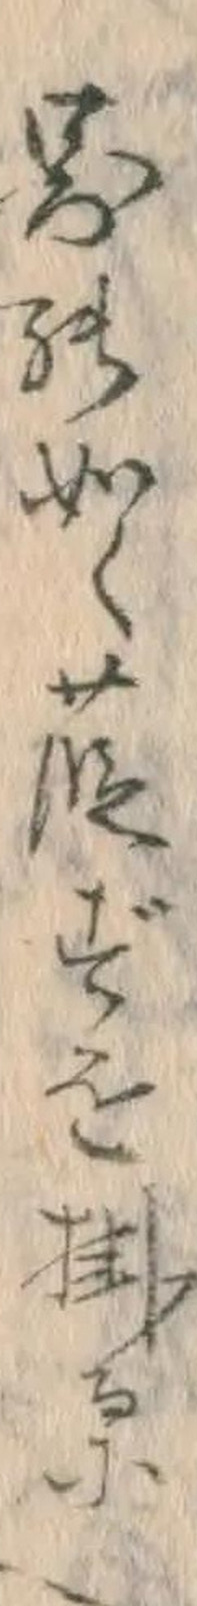図の如く葭ずを掛るに
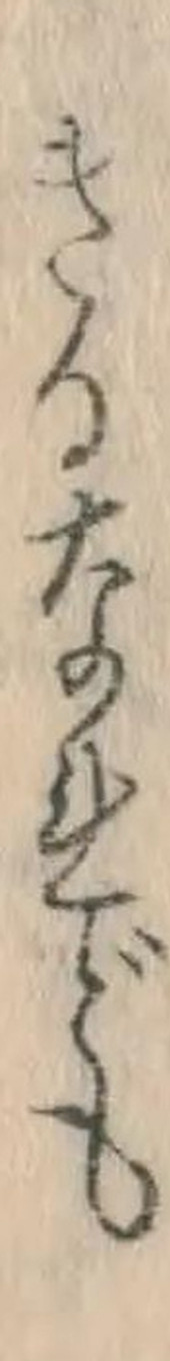きるなれども
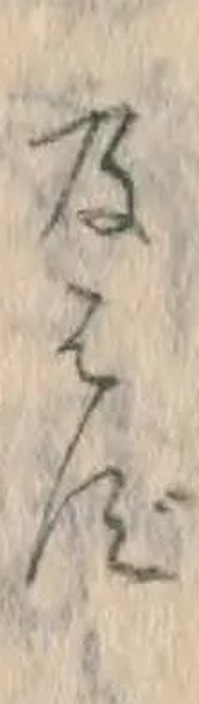及はず
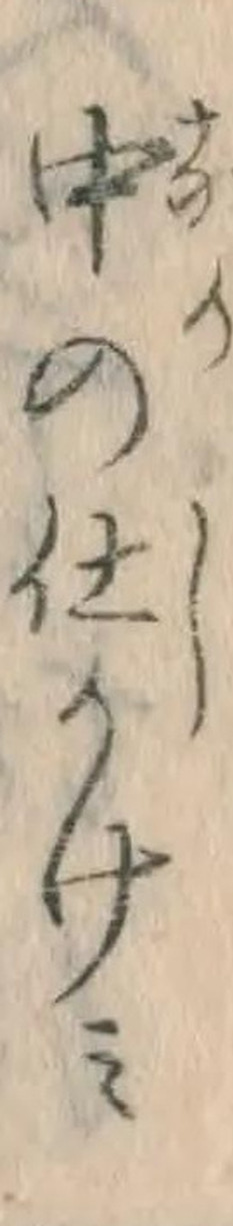中の仕かけみ
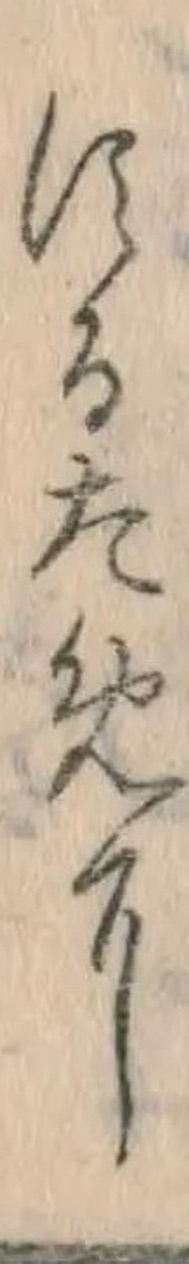するために
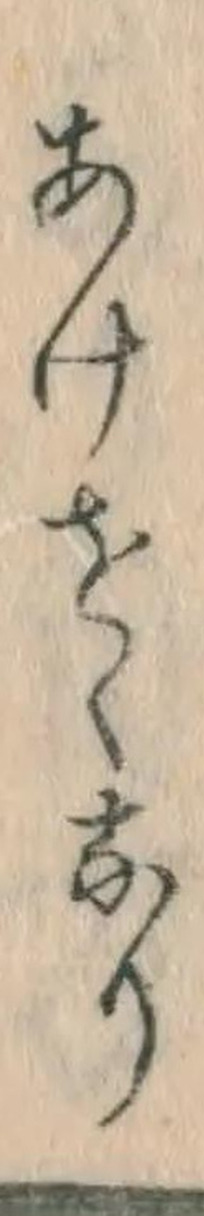あけをくなり
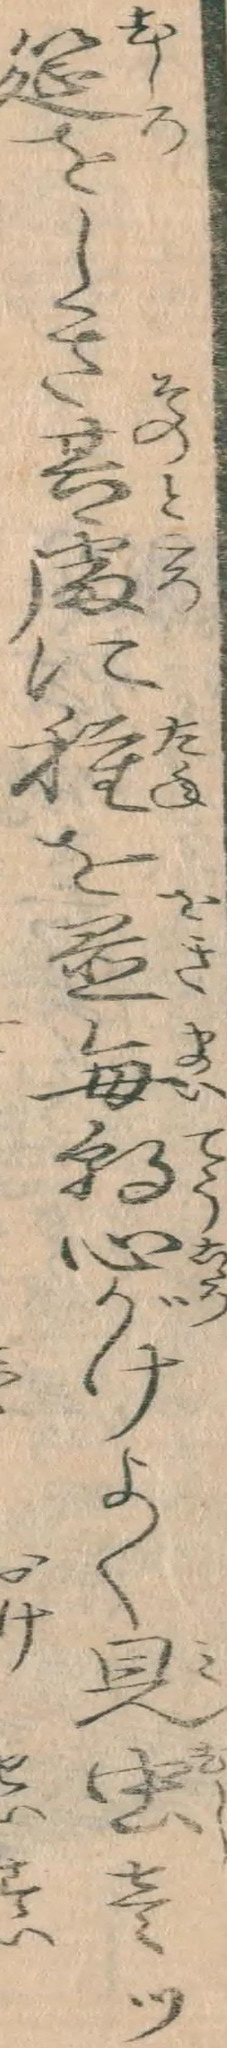筵をしき其處に種を置毎朝心がけよく見虫壱ツ
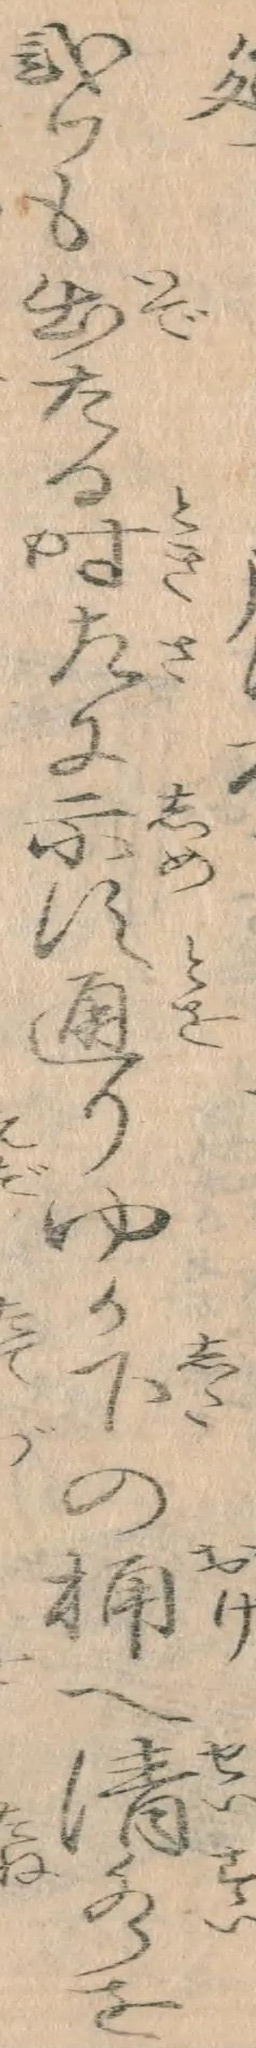弐ツも出たる時左に示す通りゆか下の桶へ清水を
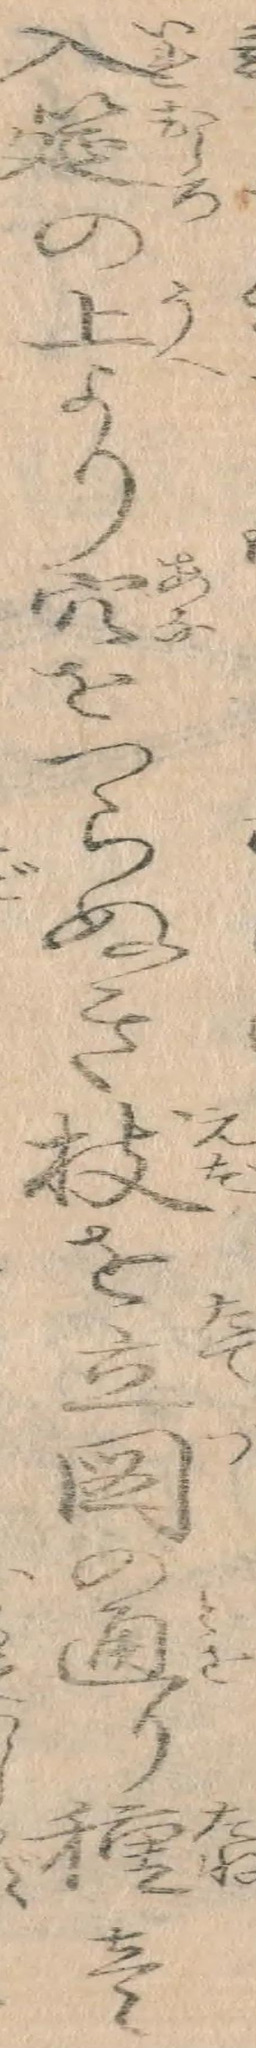入筵の上より穴をつらぬき枝を立図の通り種壱
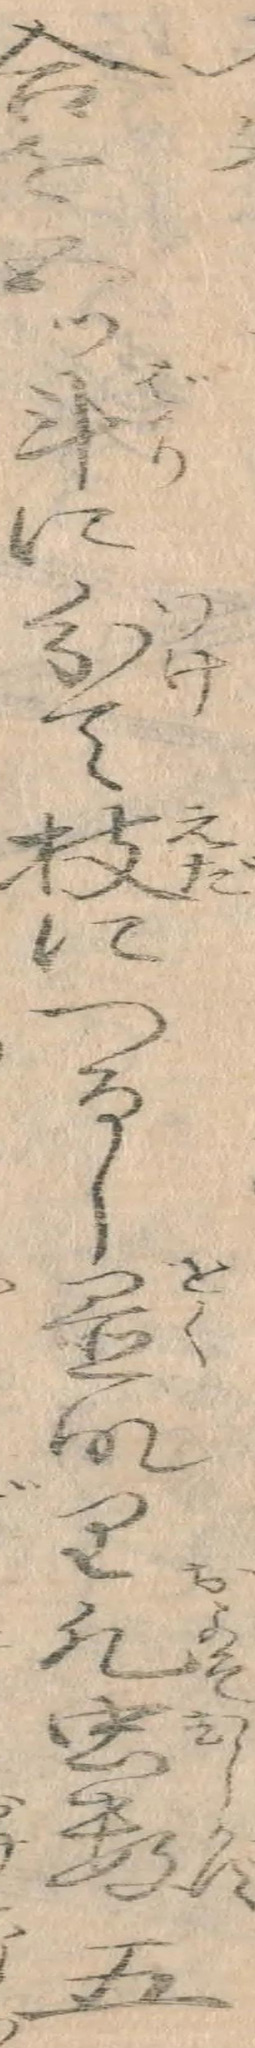合を五ツ斗に分て枝につるし置なり凡虫数五
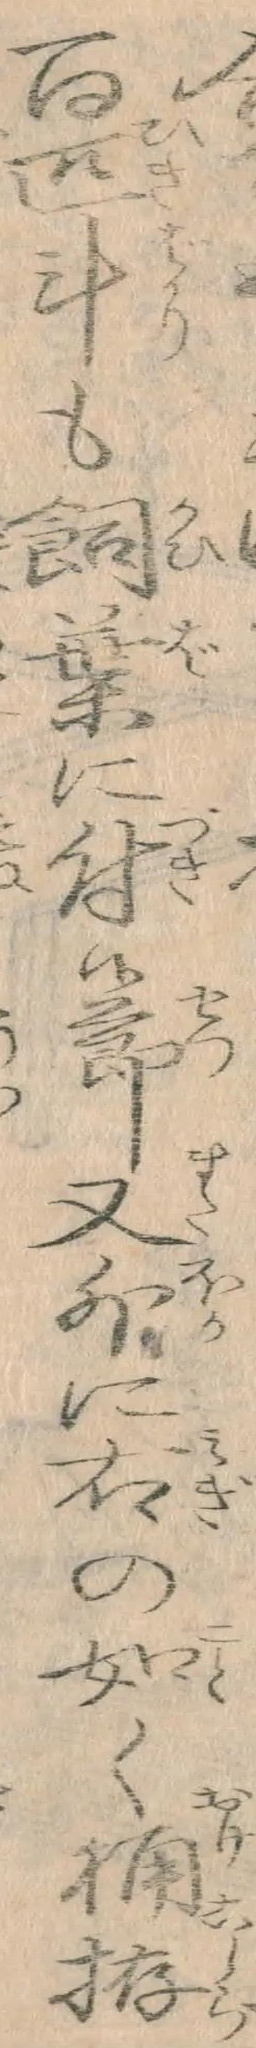百匹斗も飼葉に付候節又外に右の如く桶拵
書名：山繭養法秘傳抄
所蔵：国立国会図書館 National Diet Library, JAPAN
